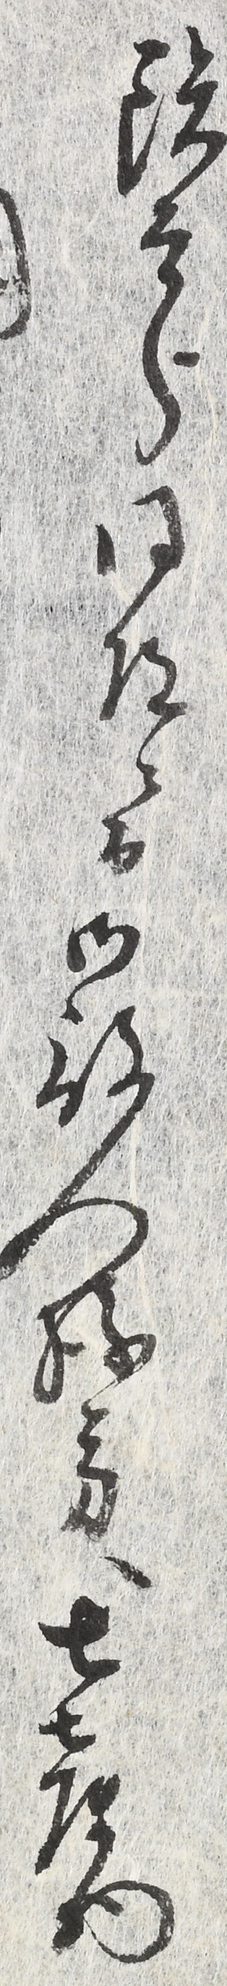鉄太郎同道ニ而御役人様方ヘ土産物
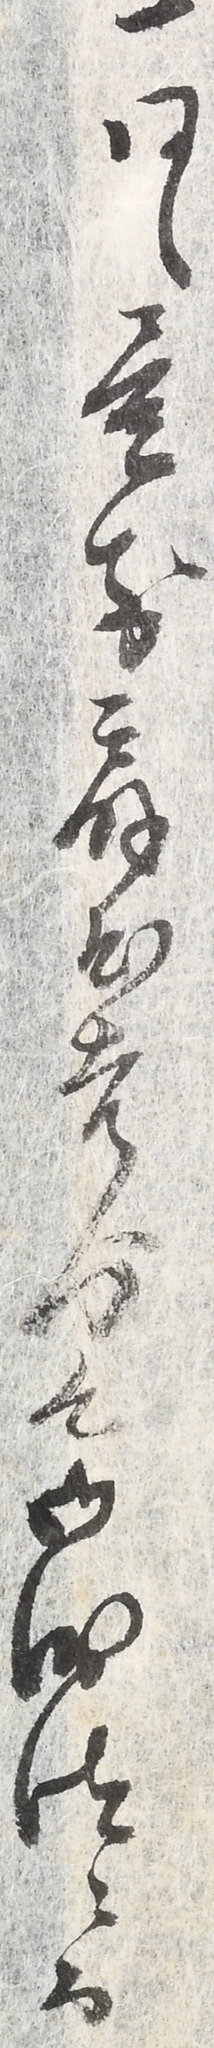一同日昼前扇屋吉右衛門殿御沙汰ニ而
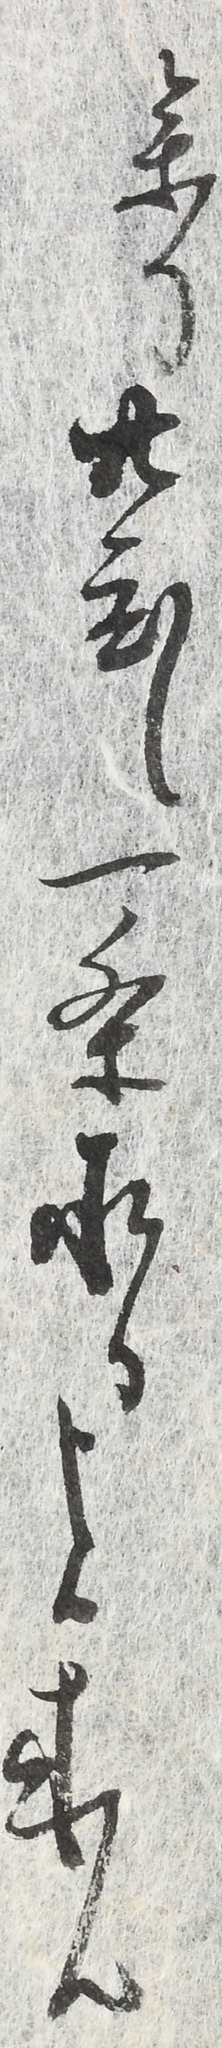参り此度之一条承り申候来ル

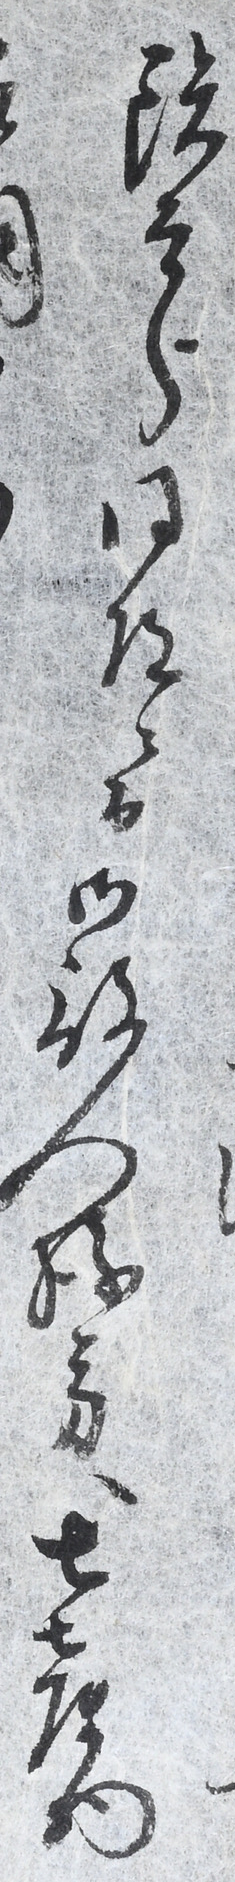鉄太郎同道ニ而御役人様方へ土産物
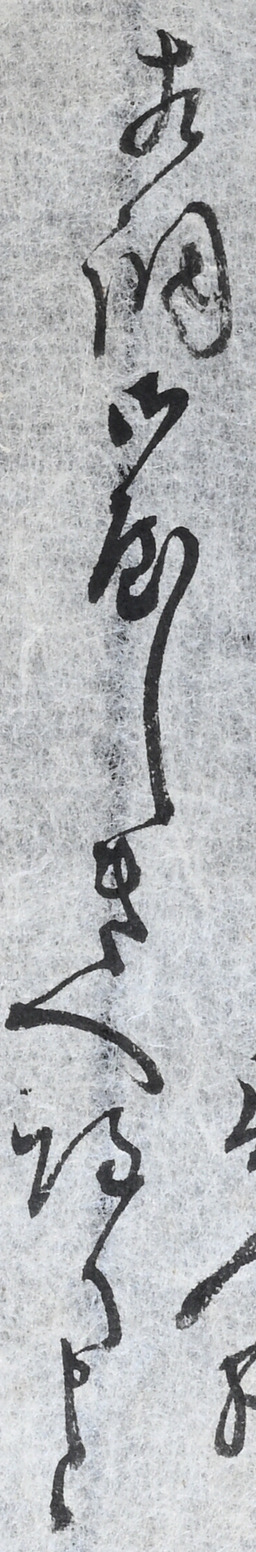相調御屋しきへ帰り申候
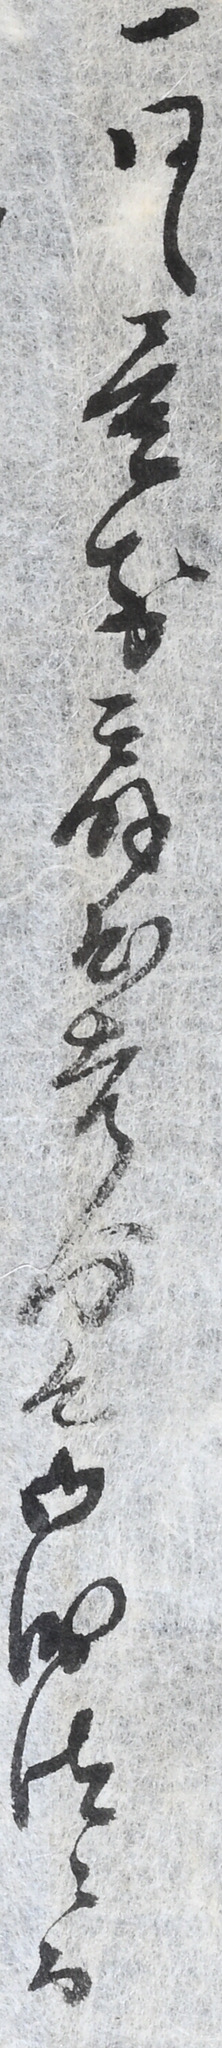一同日昼前扇屋吉右衛門殿御沙汰ニ而
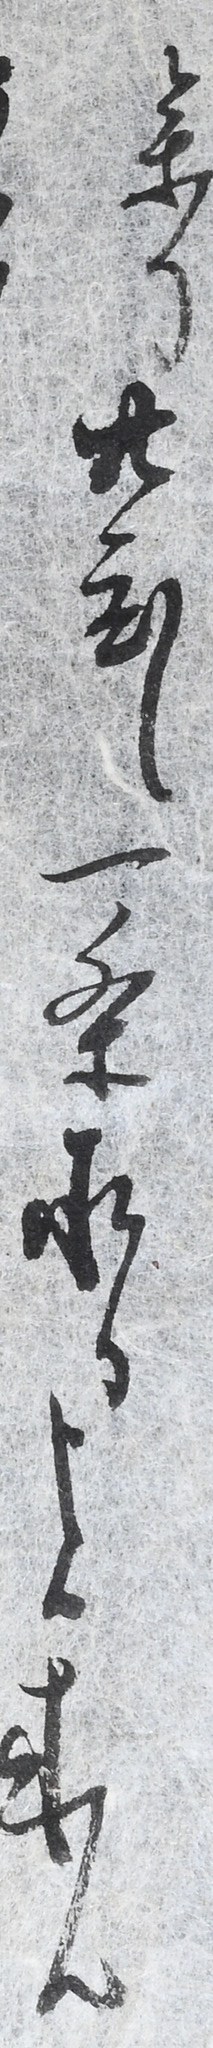参り此度之一条承り申候来ル
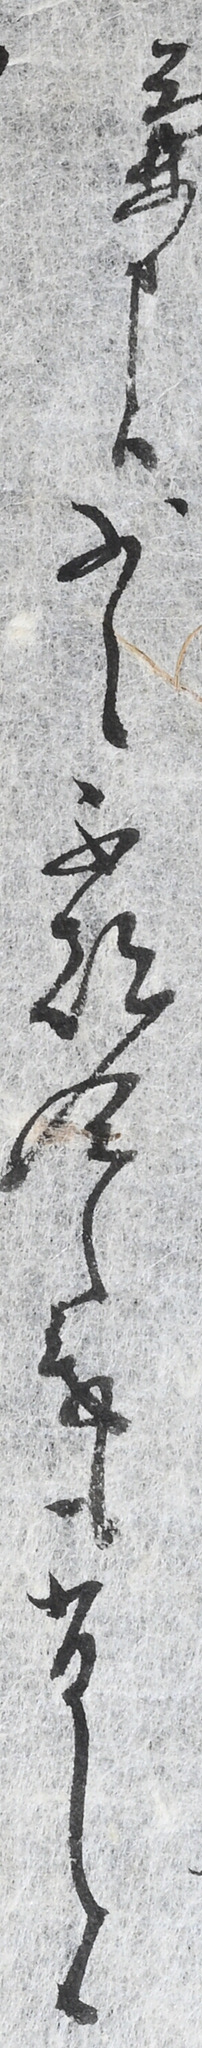兼申候、少々不都合之義有之候
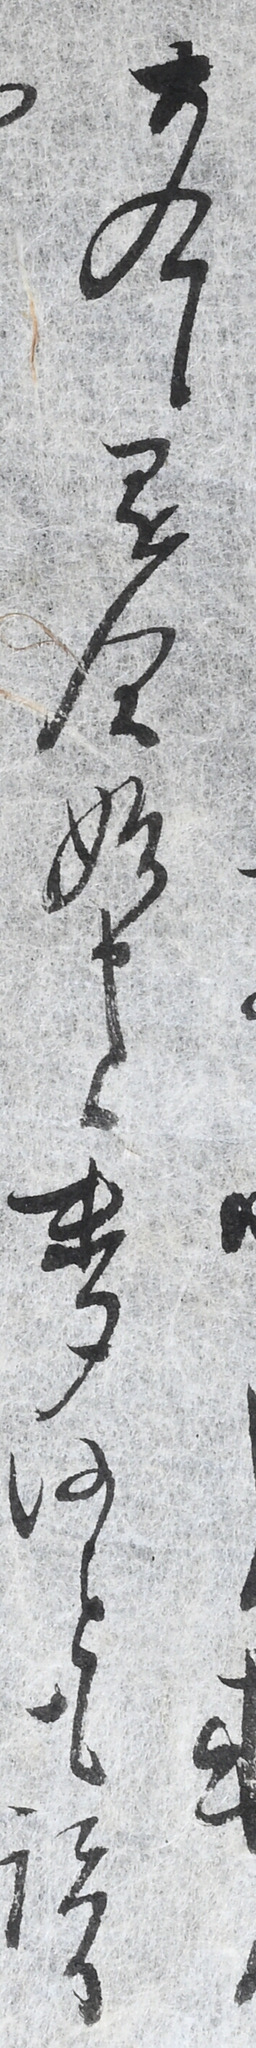廿九日懸合始申候未夕何とも詰り
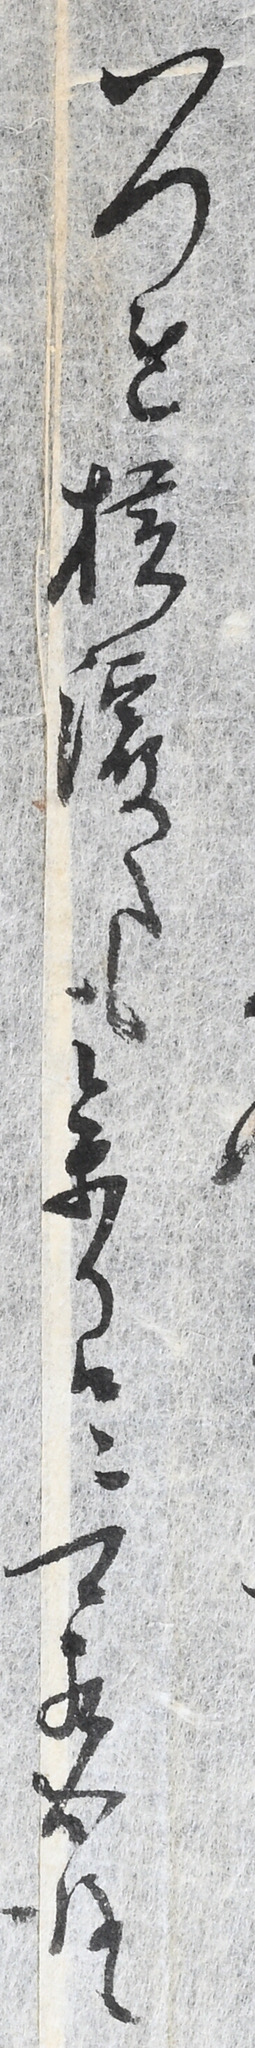いつれ横浜へも参り候ニ可相成存候
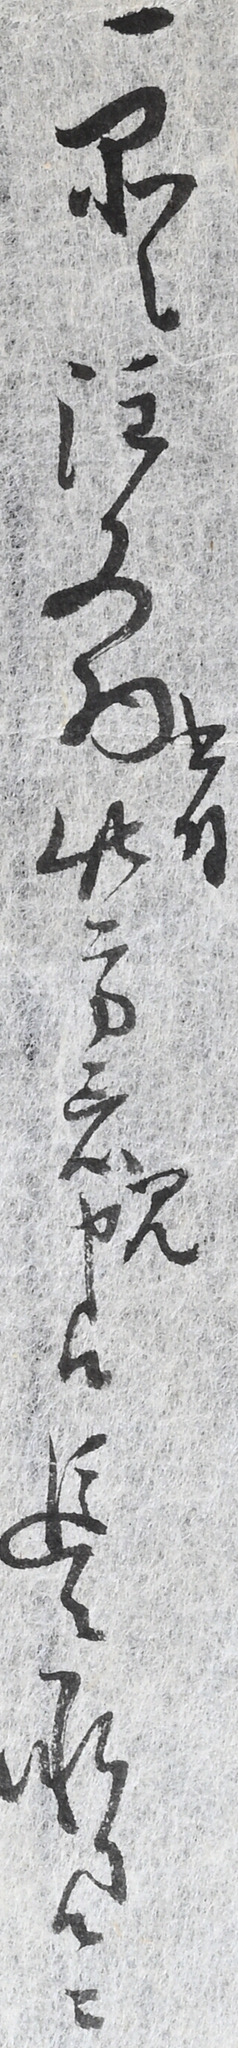一品々注文物書付此方着見申候追々承り候ニ
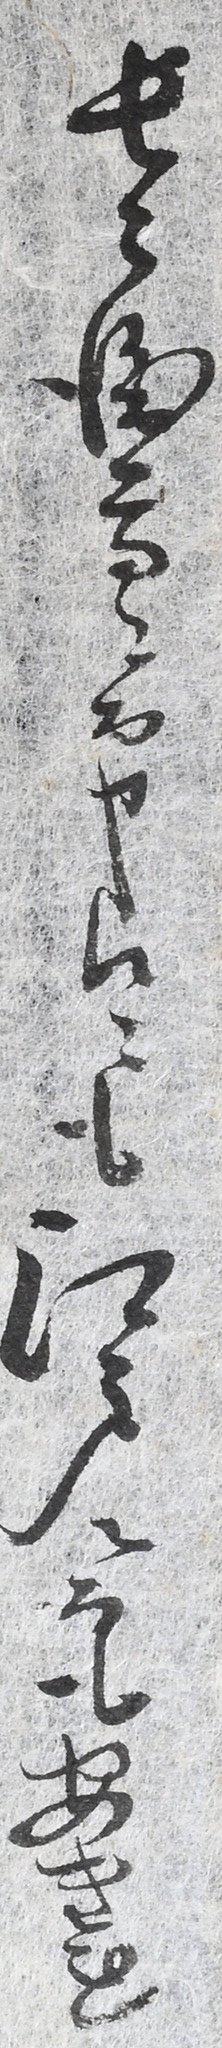長兵衛方ニ而申候ニも江戸ニ而もあきれ
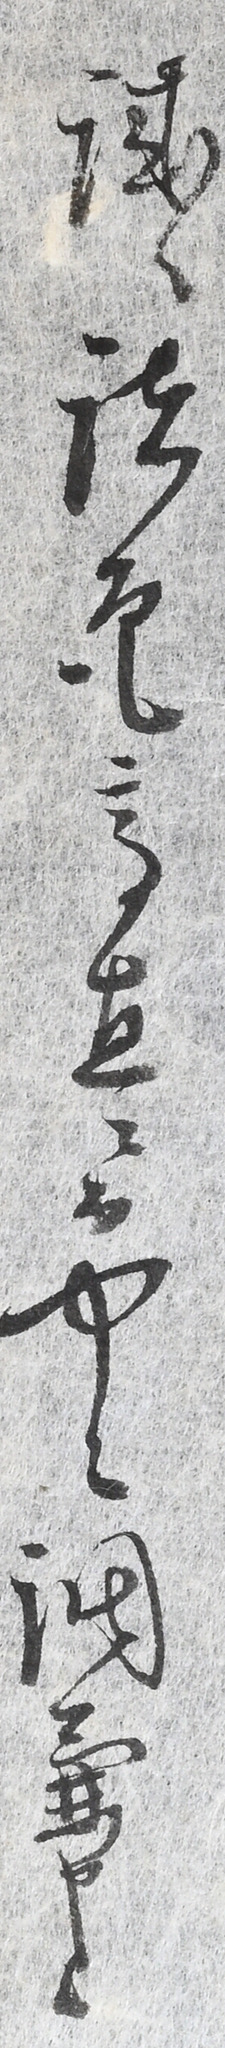誠ニ諸色高直ニ而中々調兼申候
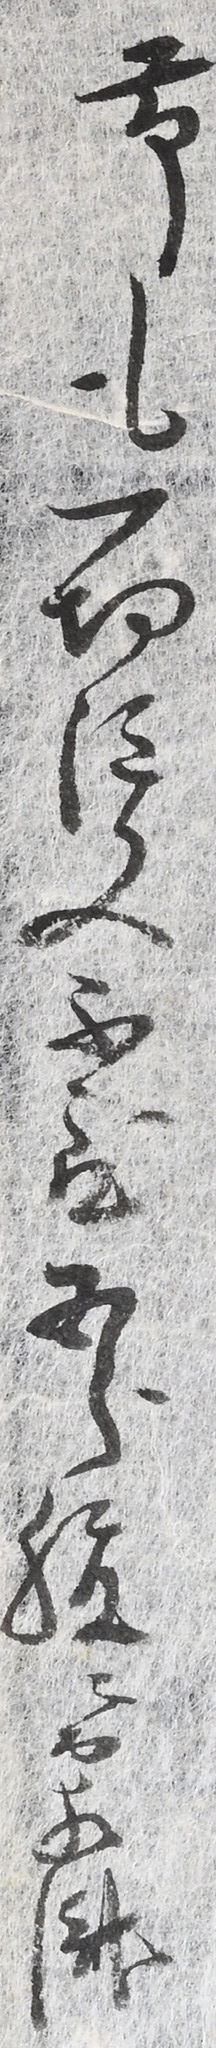帯も一切注文不致五分服ニ而相済
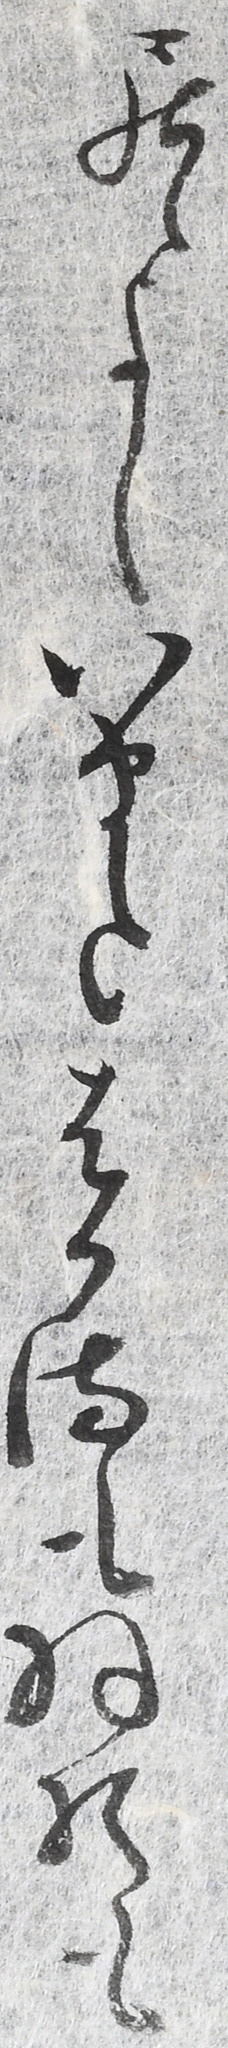居候よしいまたはかまも羽折も
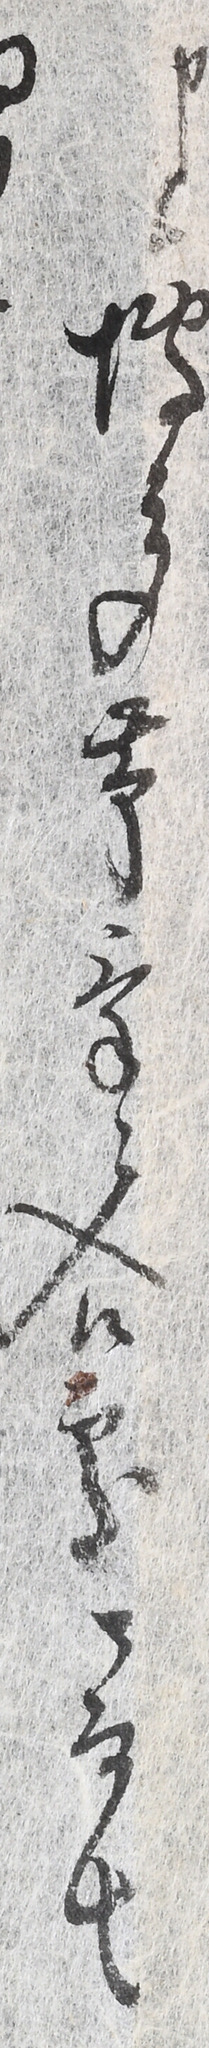申候博多帯気ニ入候處ニ而者
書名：（書状）
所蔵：伊那市立高遠町図書館・合同会社AMANE
